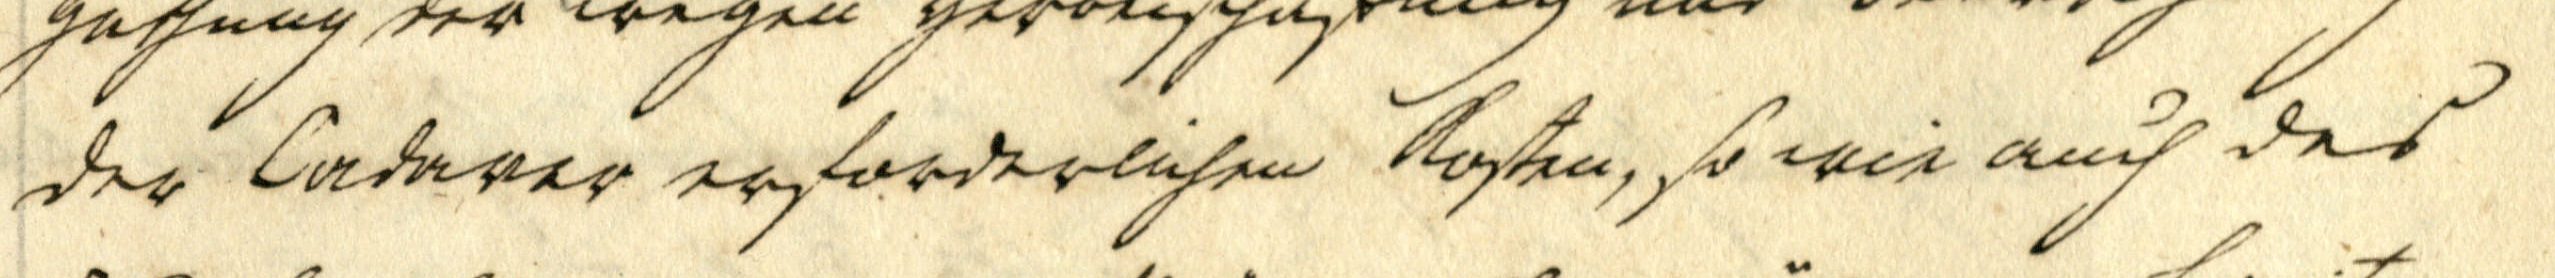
der Cadaver erforderlichen Kosten, so wie auch des
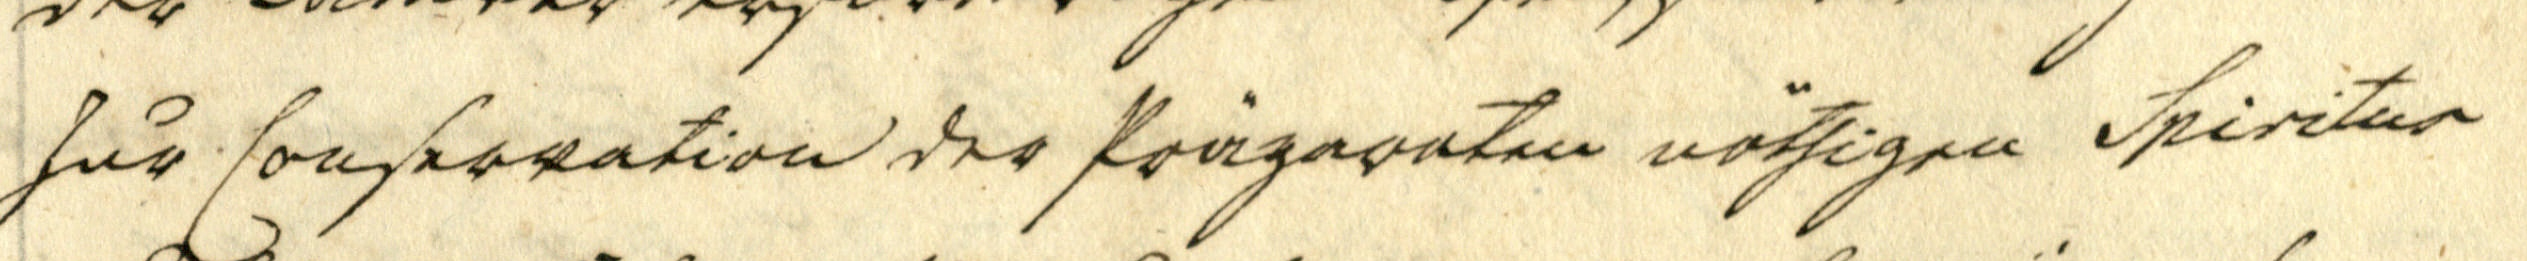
zur Conservation der Präparaten nöthigen Spiritus
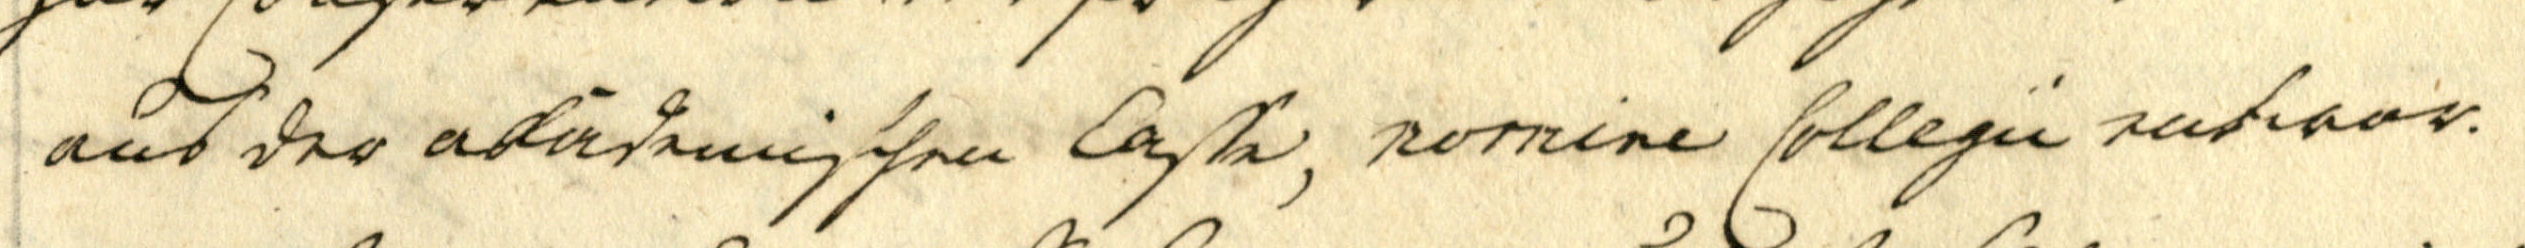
aus der akademischen Casse, nomine Collegii entwor¬
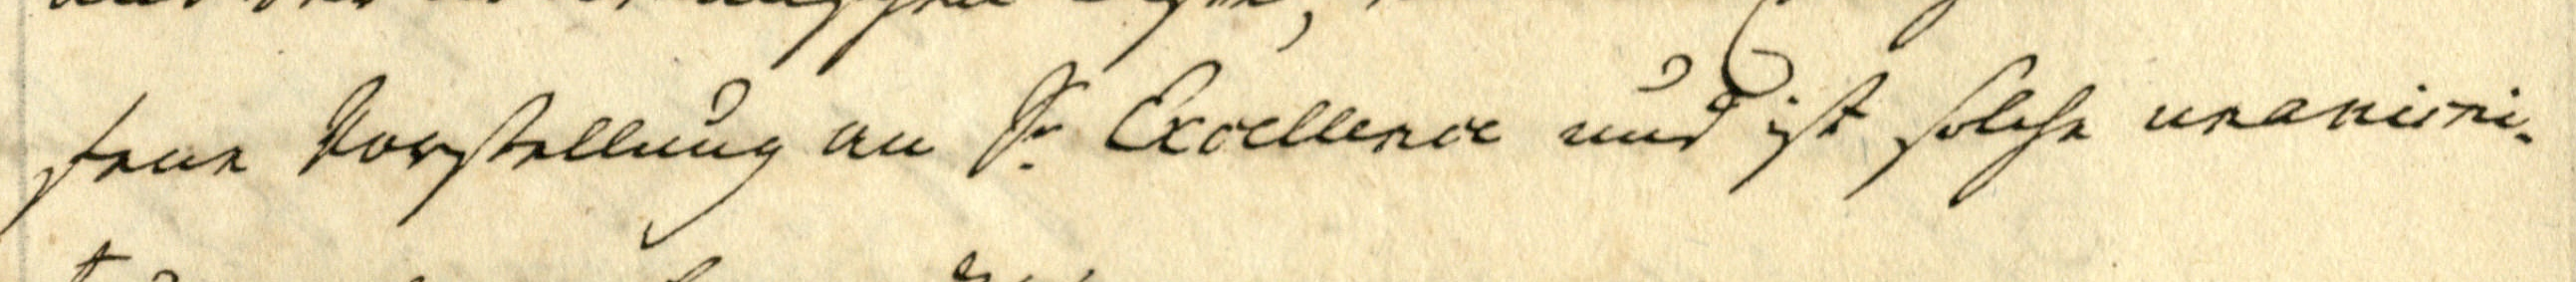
fene Vorstellung an Sr Excellence und ist solche unanimi¬
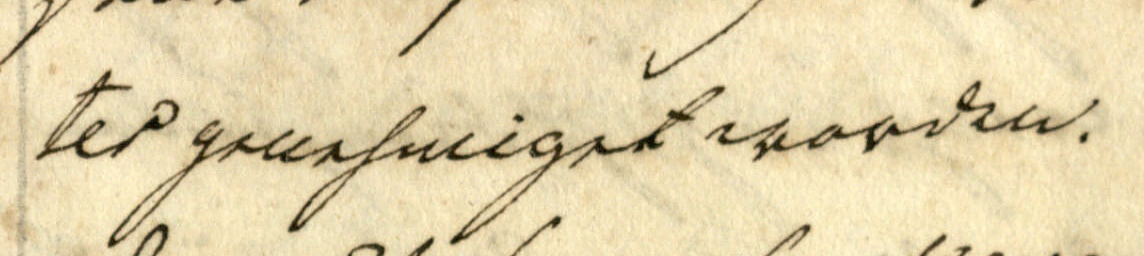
tes genehmiget worden.
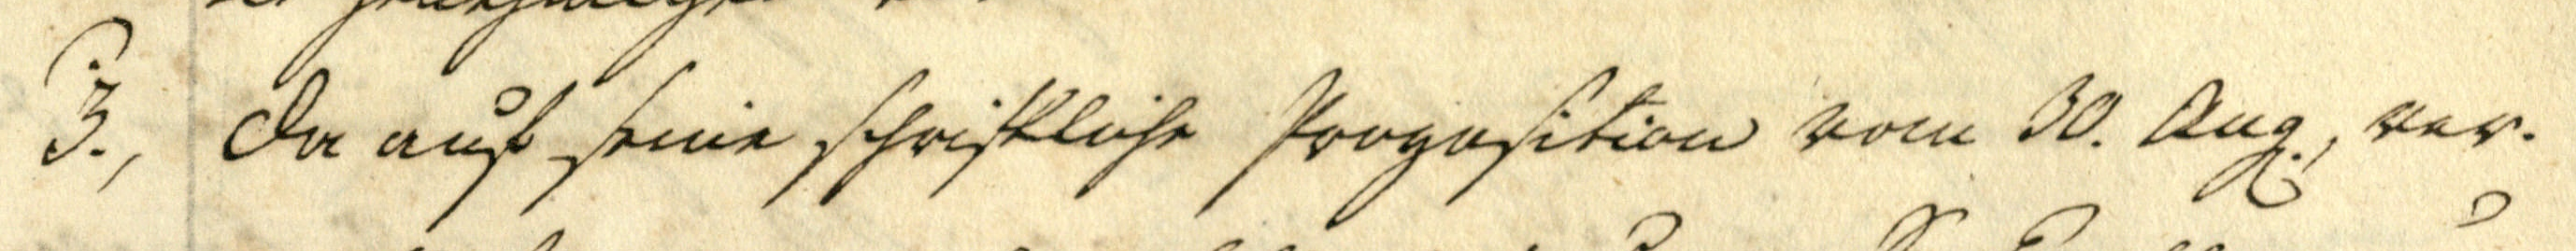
3., Da auf seine schriftliche Proposition vom 30. Aug. ver¬
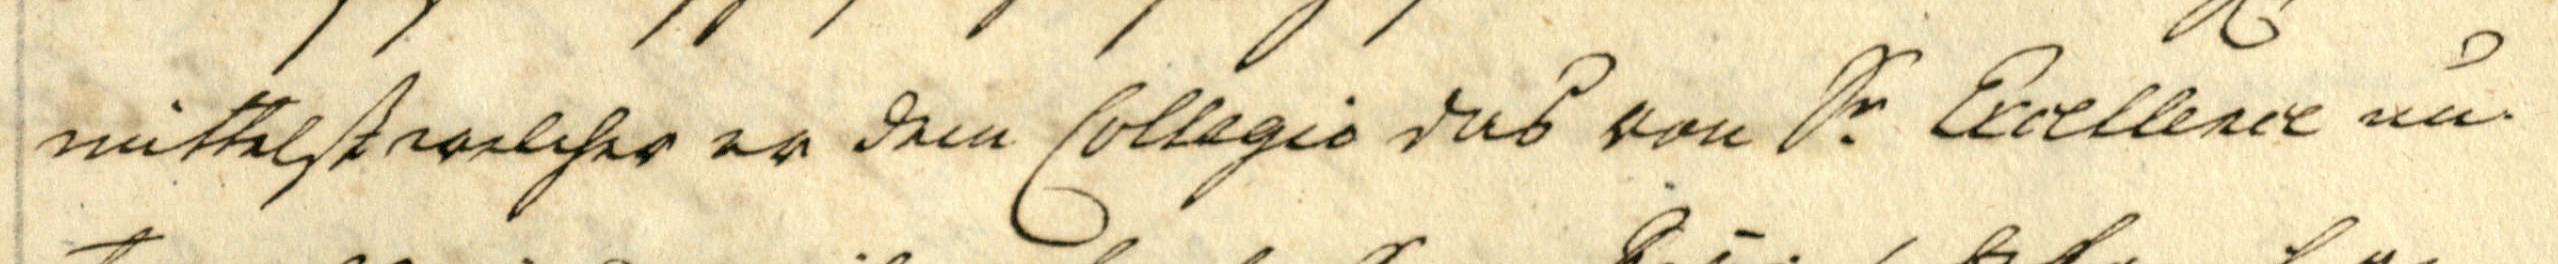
mittelst welcher er dem Collegio das von Sr. Excellence un¬
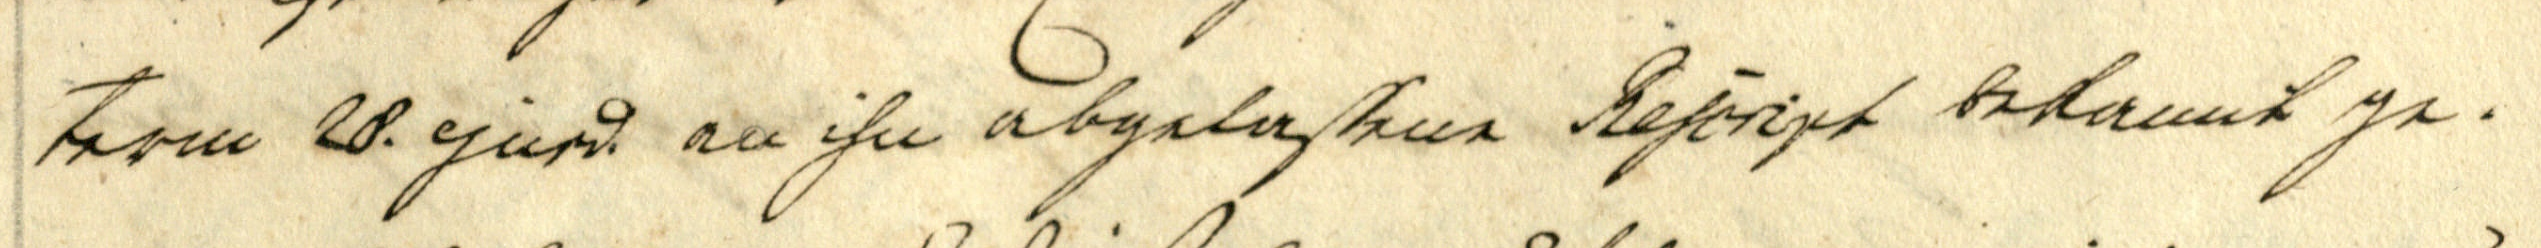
term 28. ejusd. an ihn abgelassene Rescript bekannt ge¬
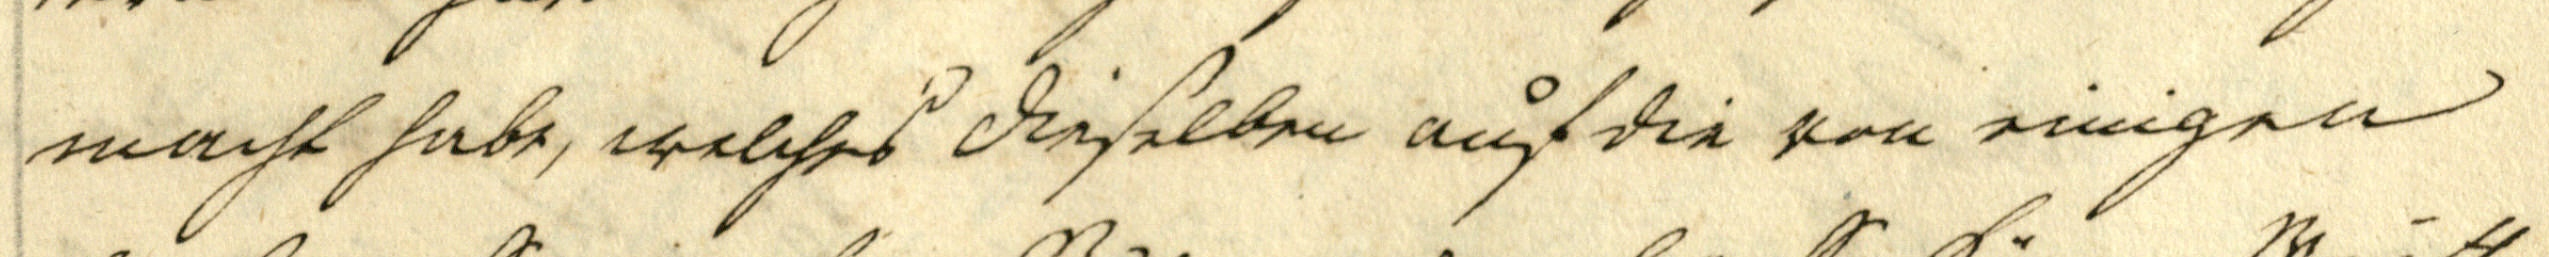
macht habe, welches dieselben auf die von einigen
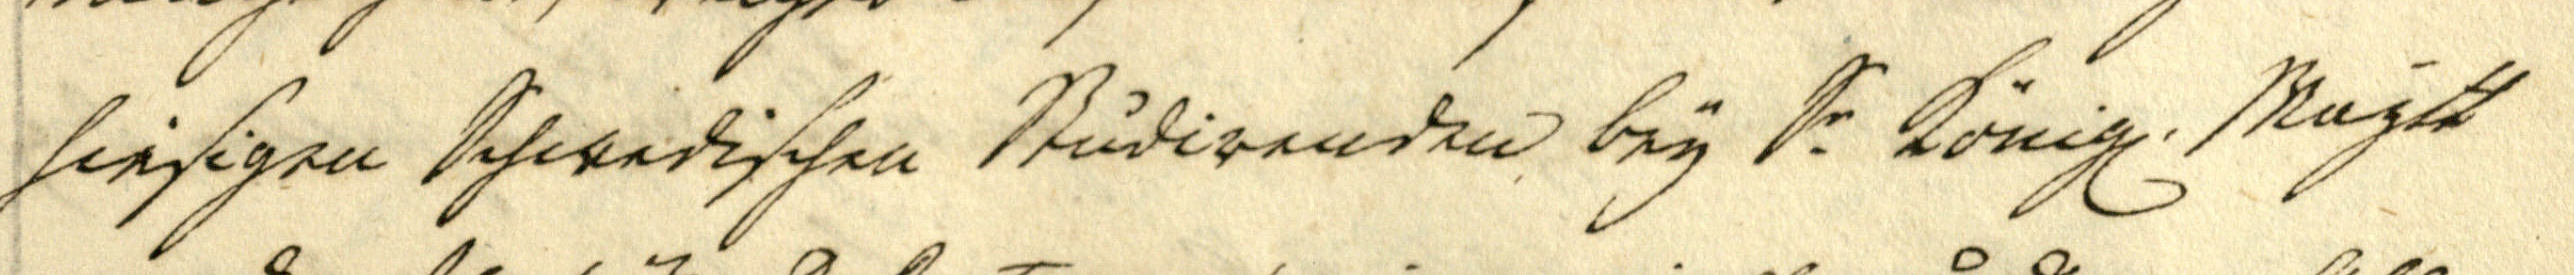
hiesigen Schwedischen Studirenden beÿ Sr. Königl. Maÿtt.
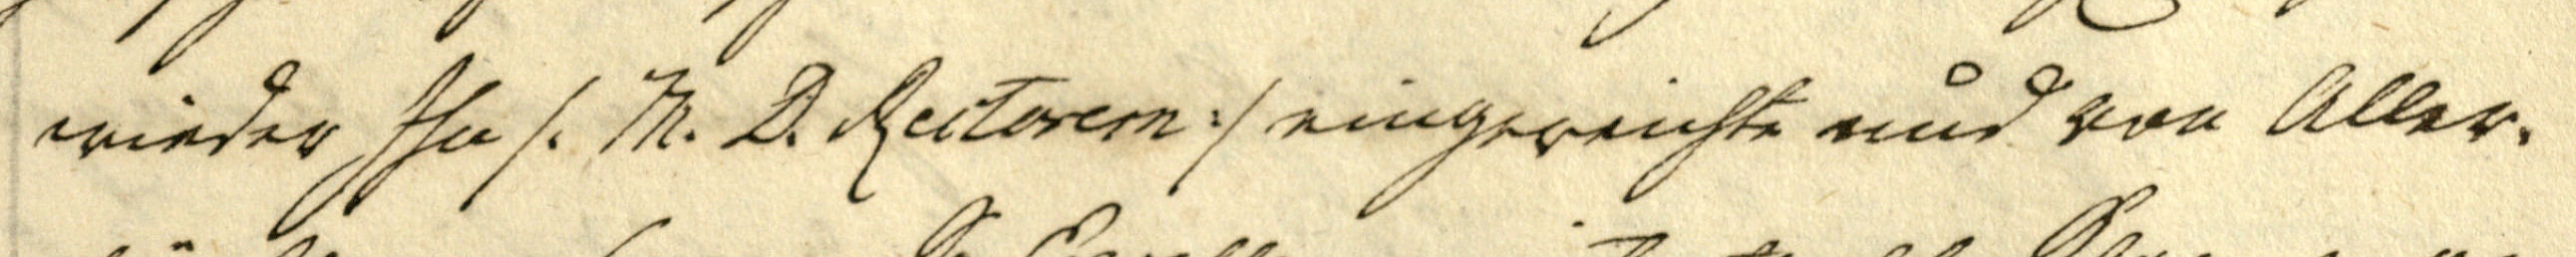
wieder Ihn / M. D. Rectorem:/ eingereichte und von Aller¬
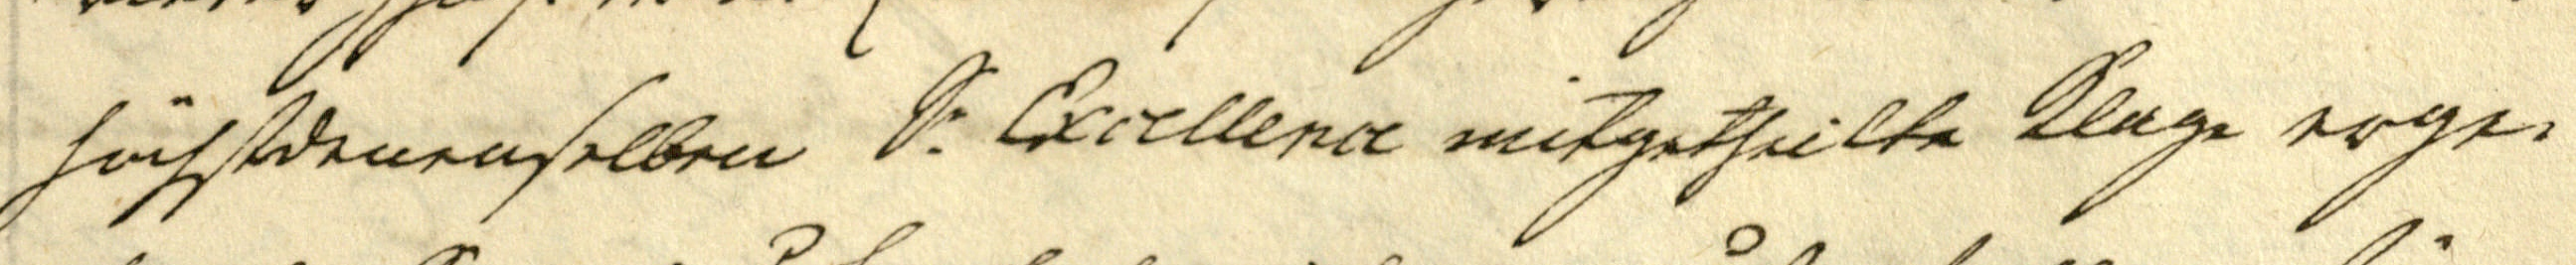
höchstdenenselben Sr. Excellence mitgetheilte Klage erge¬
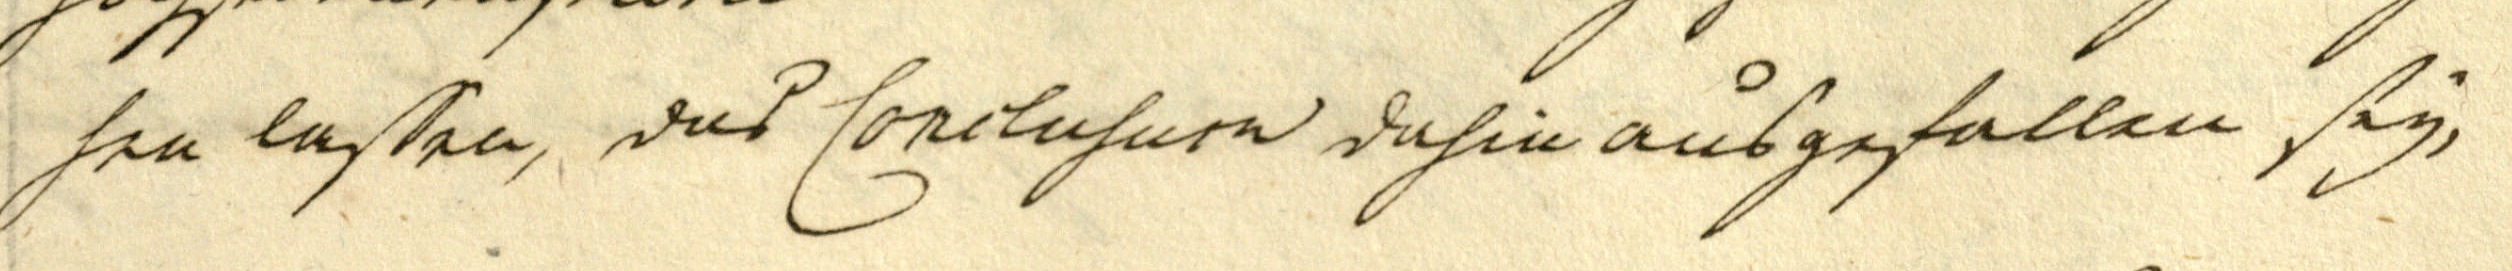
hen lassen, das Conclusum dahin ausgefallen seÿ,
